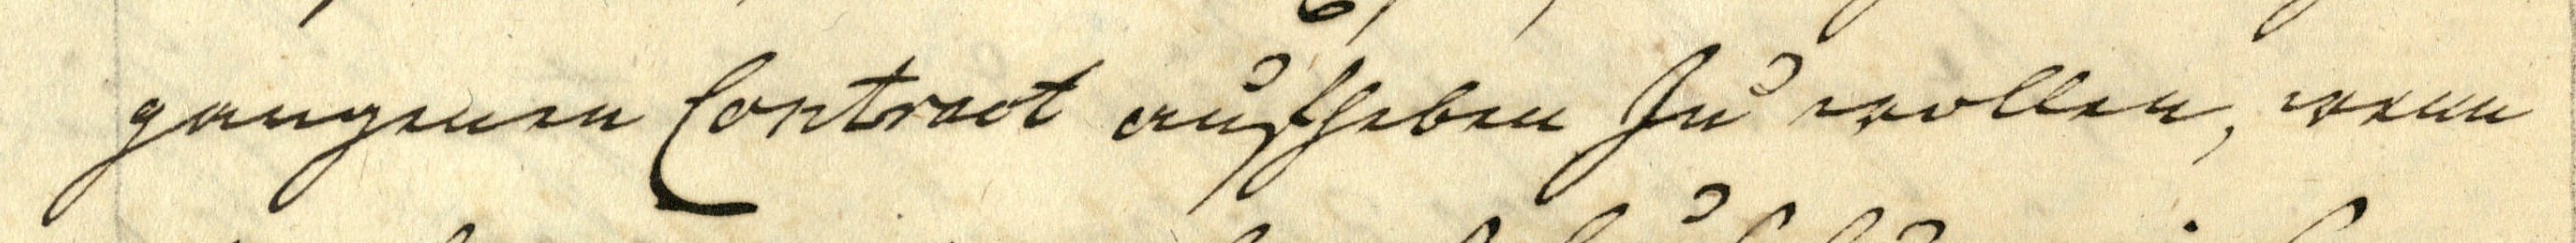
gangenen Contract aufgeben zu wollen, wenn
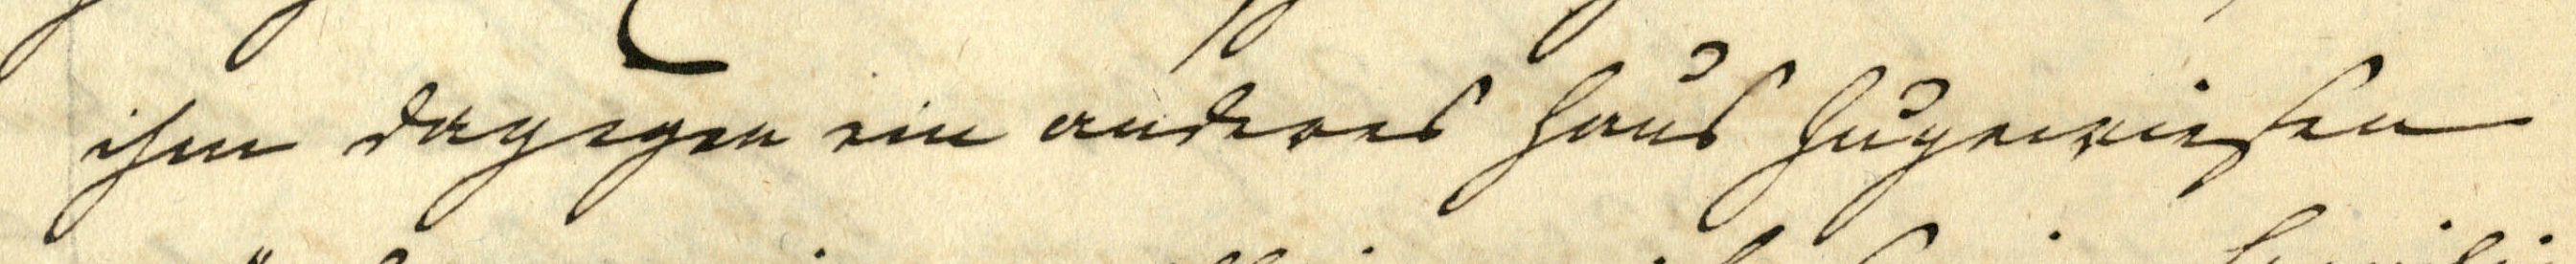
ihm dagegen ein anderes Haus zugewiesen
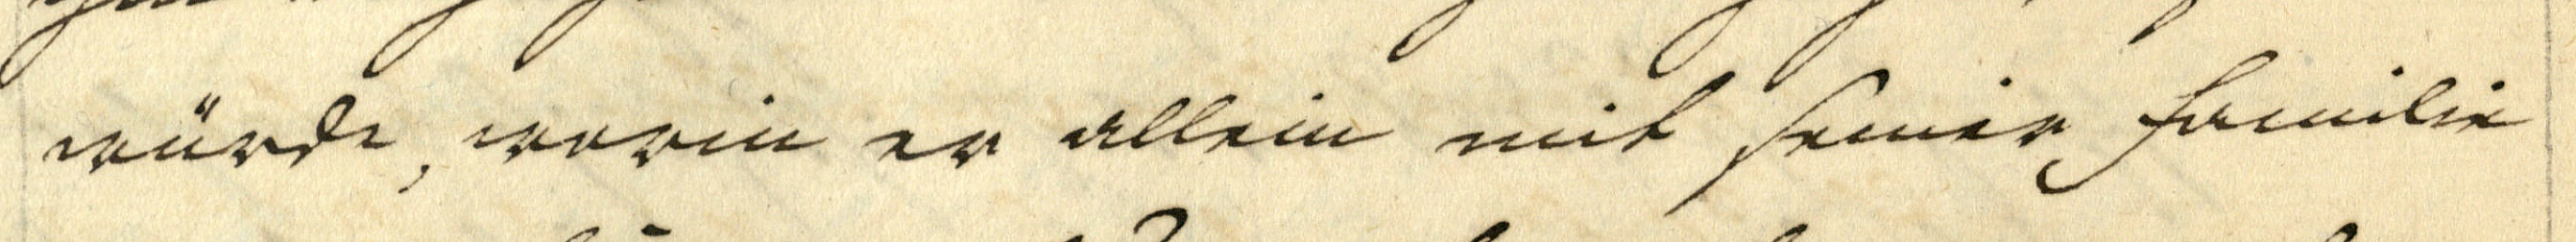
würde, worin er allein mit seiner Familie
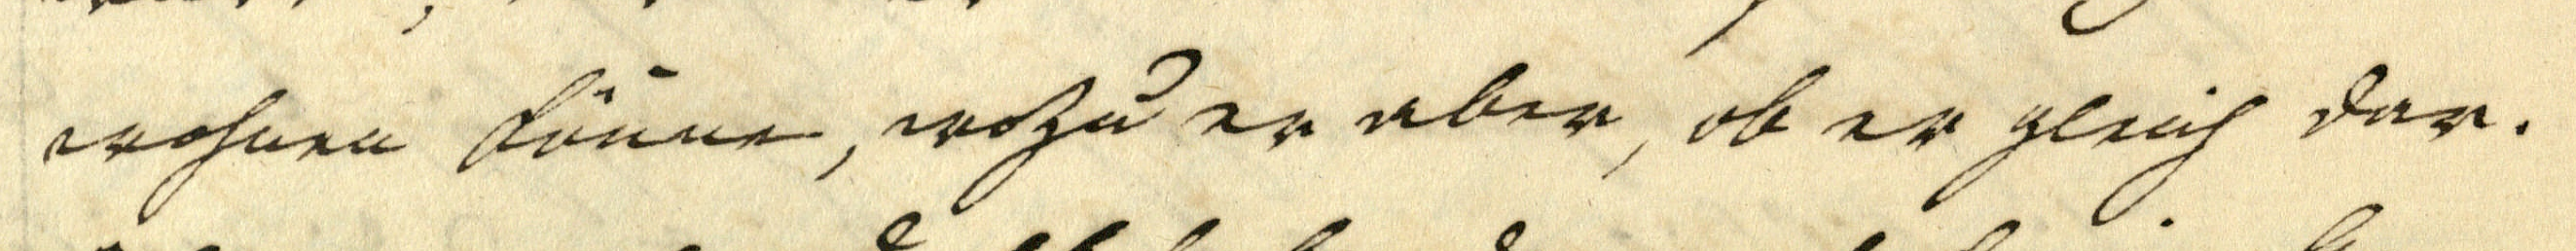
wohnen könne, wozu er aber, ob er gleich dar¬
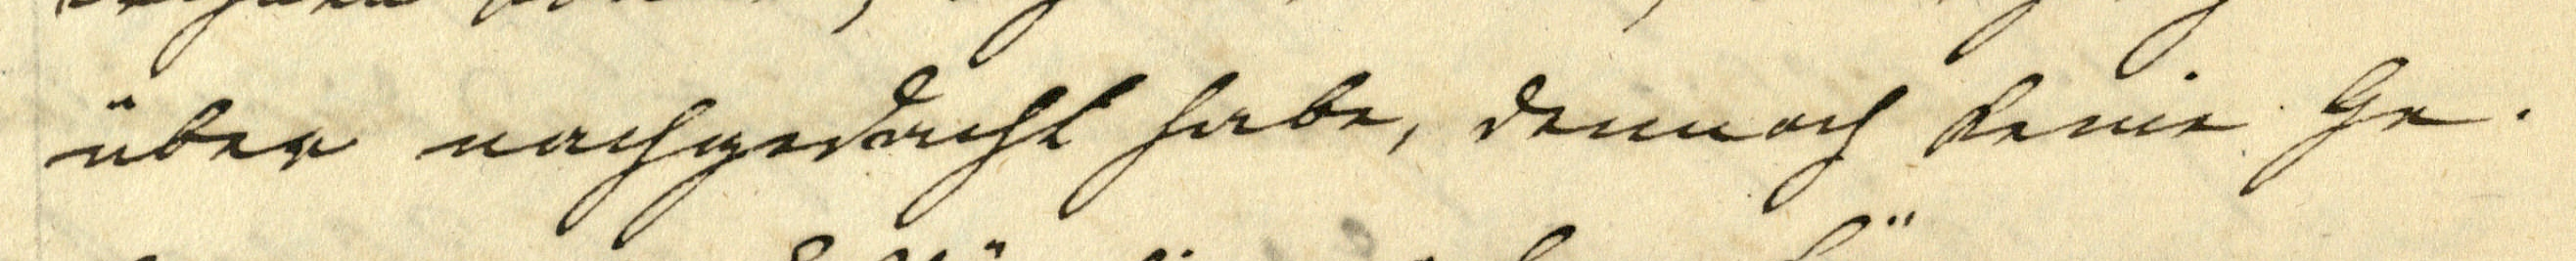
über nachgedacht habe, dennoch keine Ge¬
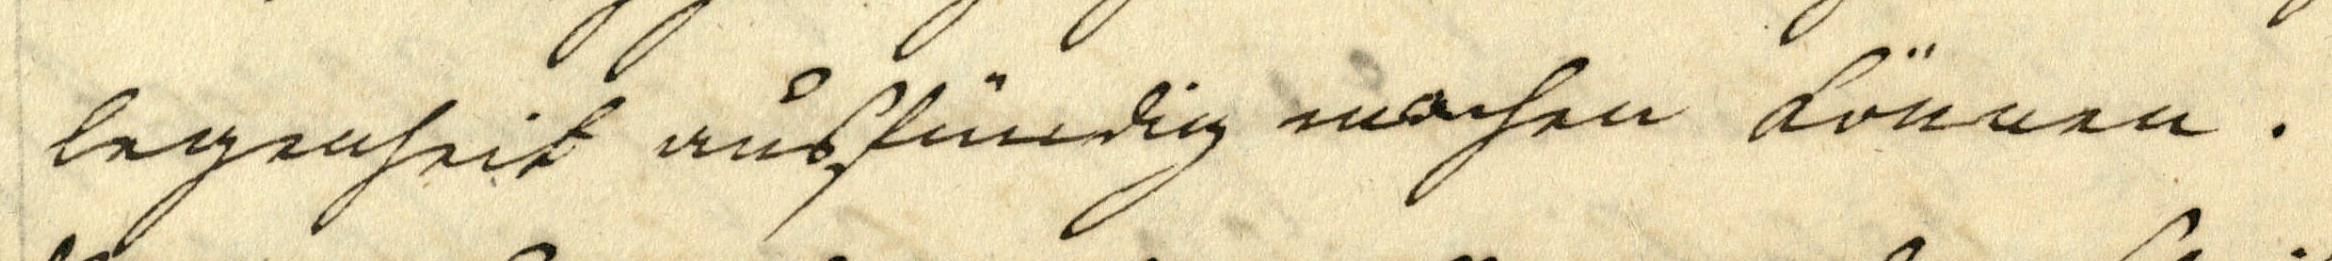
legenheit ausfindig machen können.
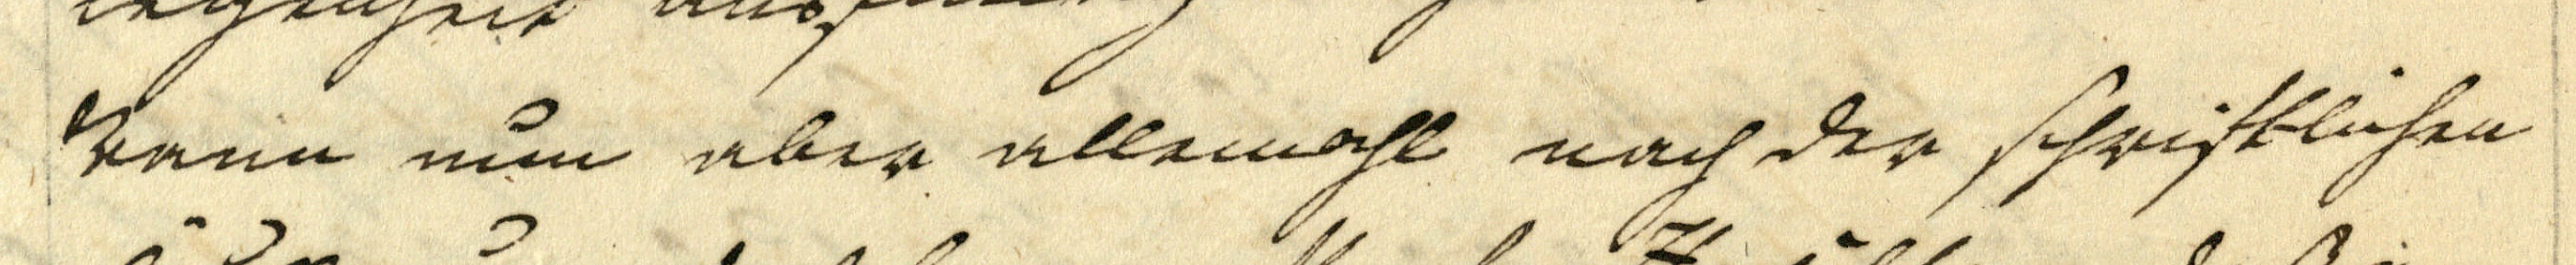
Wann nun aber allemahl nach der schriftlichen
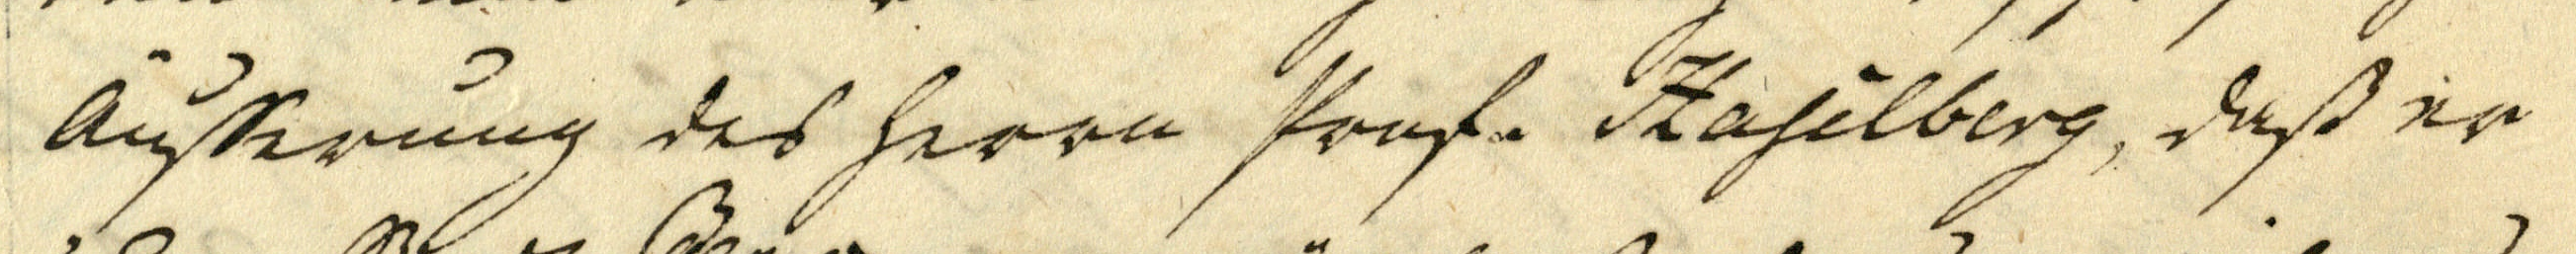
Äusserung des Herrn Prof. Haselberg, daß er
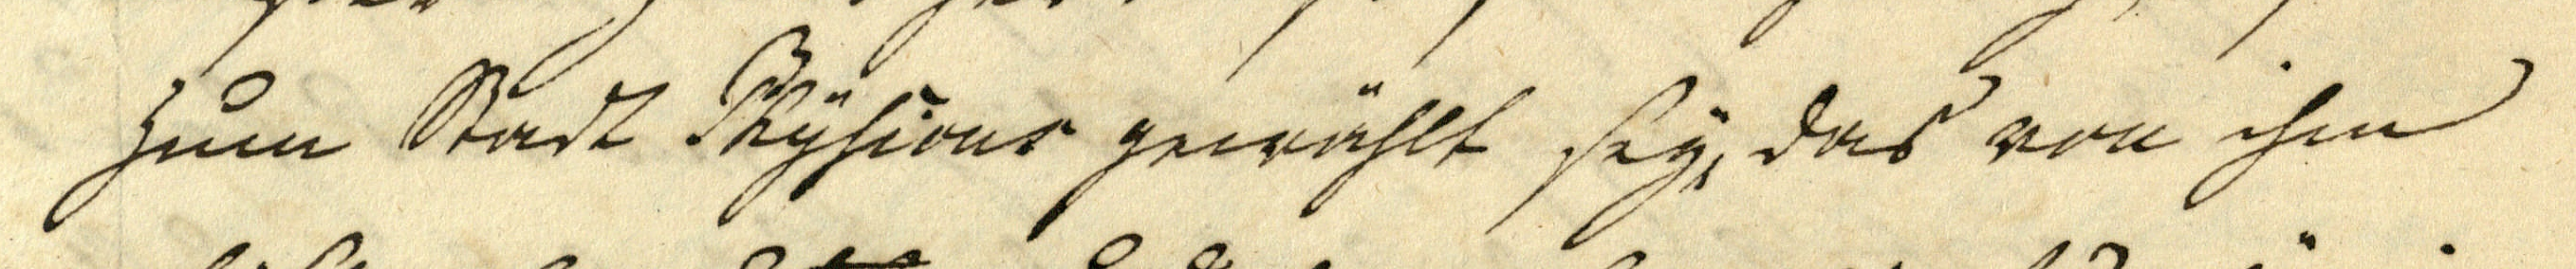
zum Stadt Phÿsicus gewählt seÿ, das von ihm
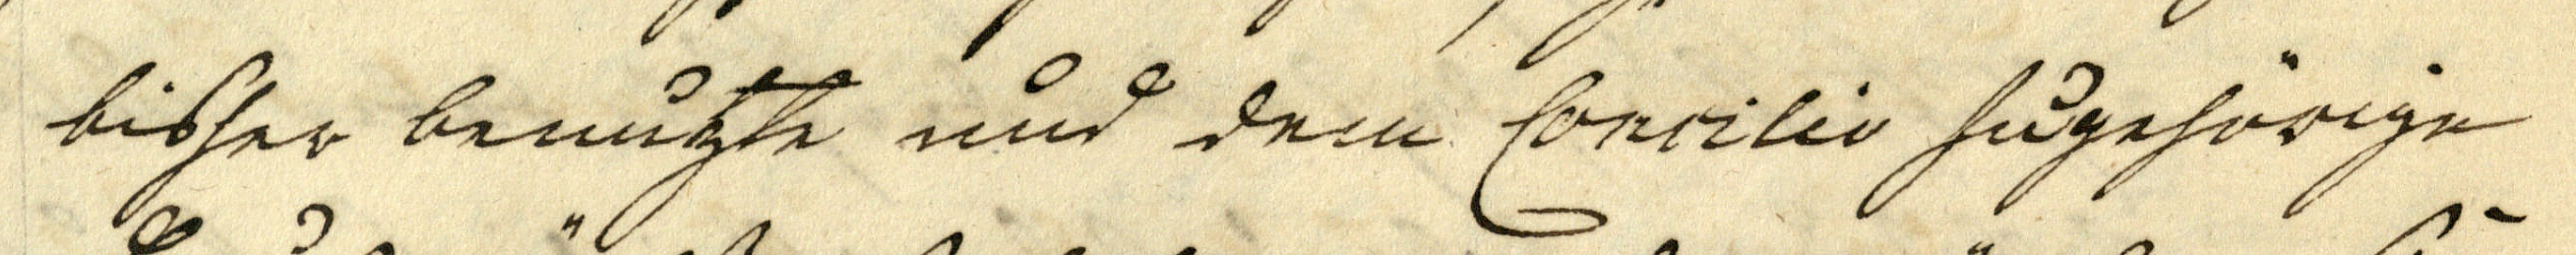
bisher benutzte und dem Concilio zugehörige
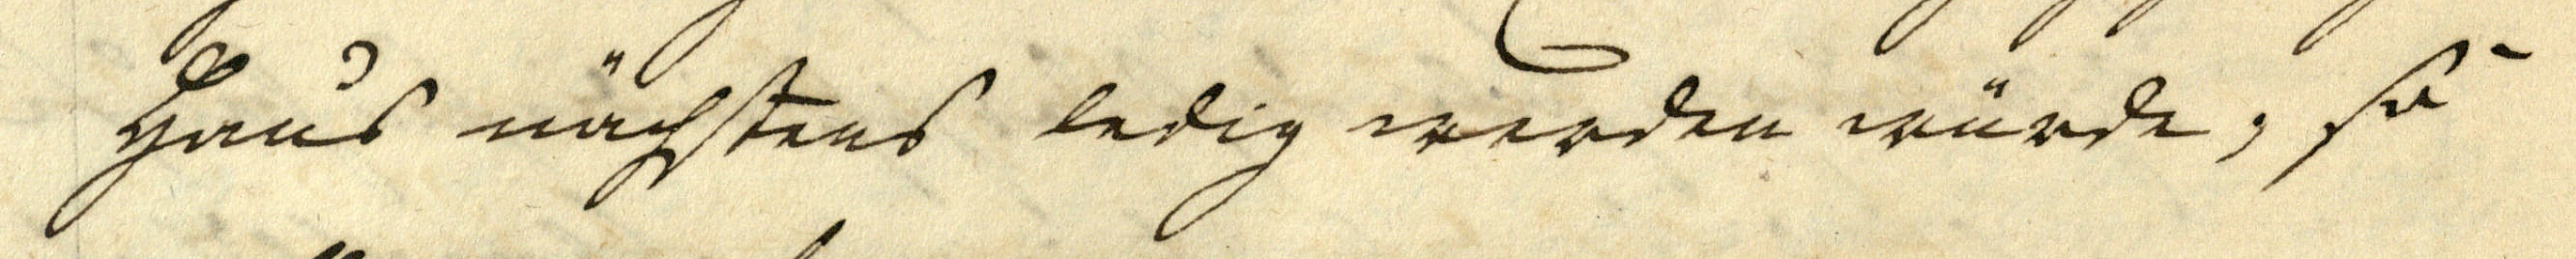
Haus nächstens ledig werden würde, so
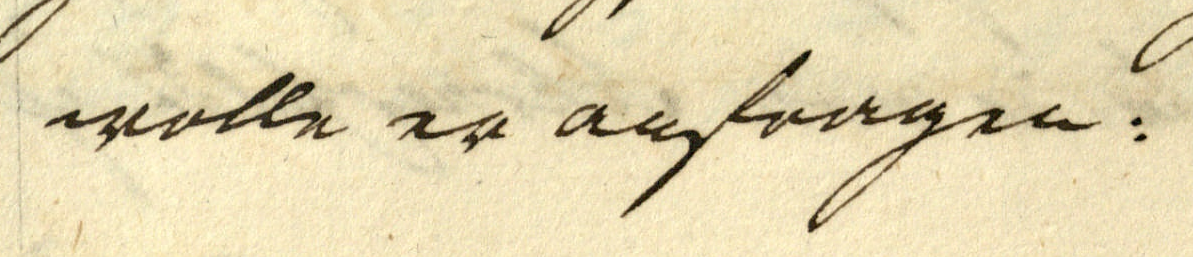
wolle er anfragen:
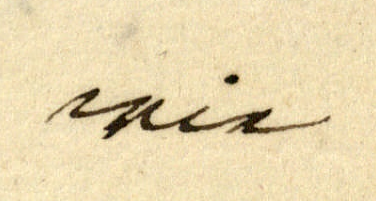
wie
